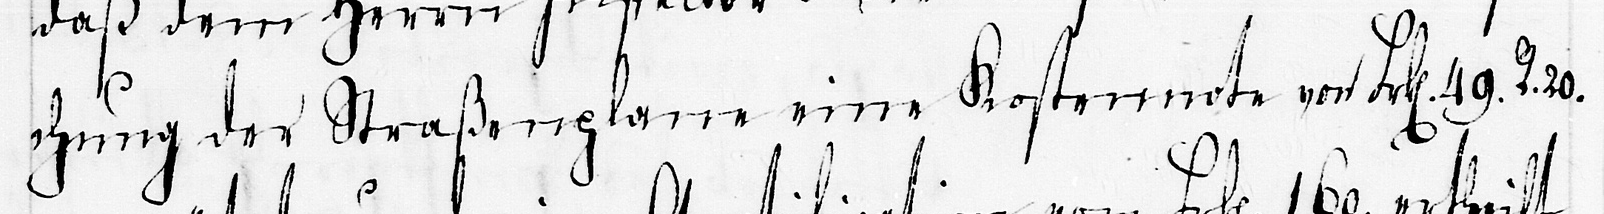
chung der Straßenplane eine Kostennote von Frk[en]. 49.
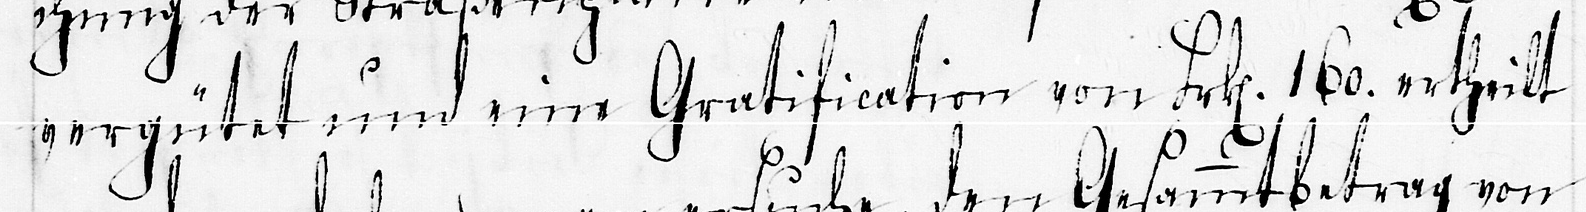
vergütet und eine Gratification von Frk[en]. 160. ertheilt
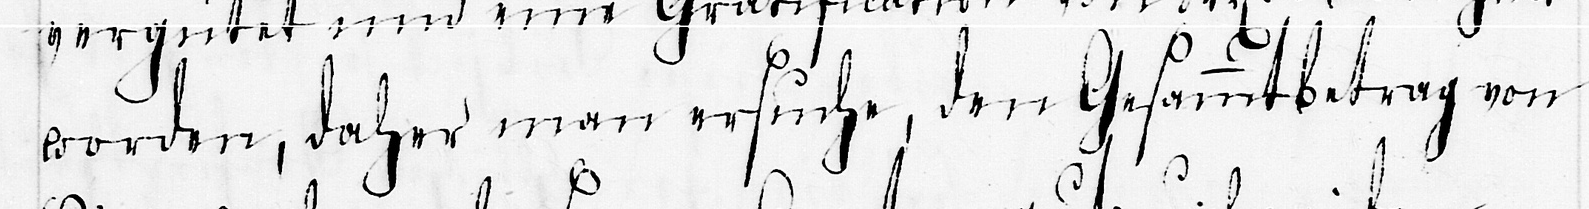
worden, daher man ersuche, den Gesammtbetrag von
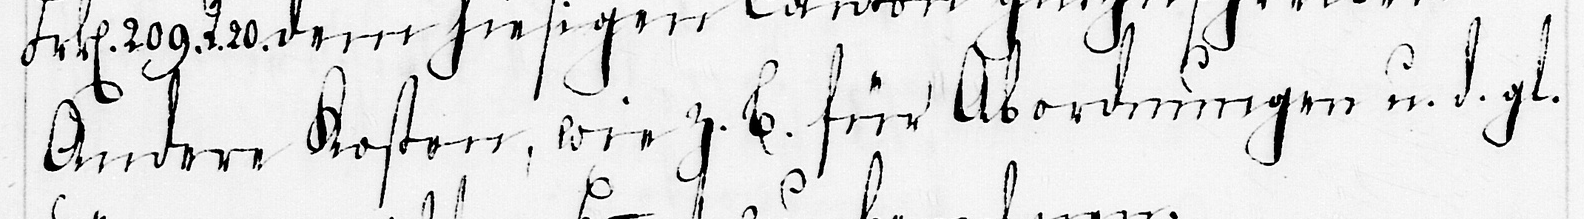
Andere Kosten, wie z. B. für Abordnungen u. d. gl.
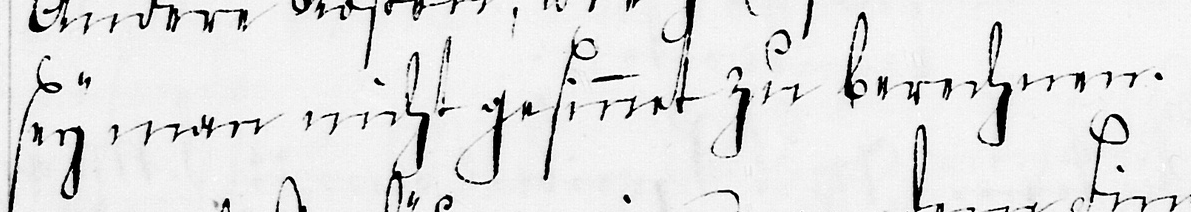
sey man nicht gesinnet zu berechnen.
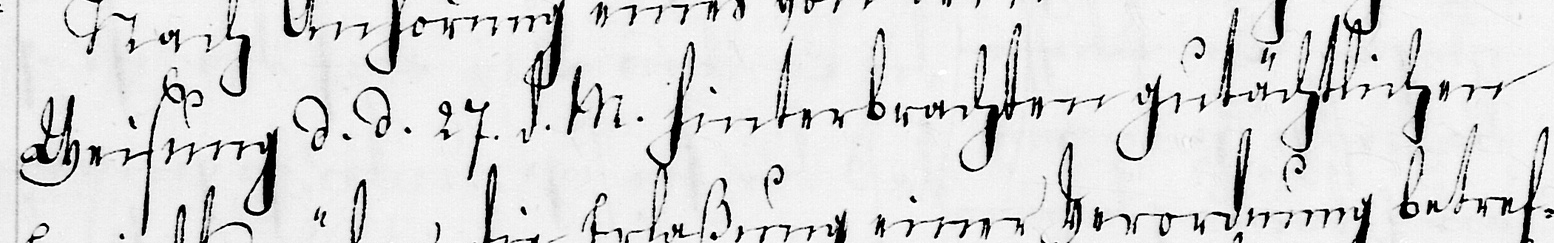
Weisung d. d. 27. d. M. hinterbrachten gutächtlichen
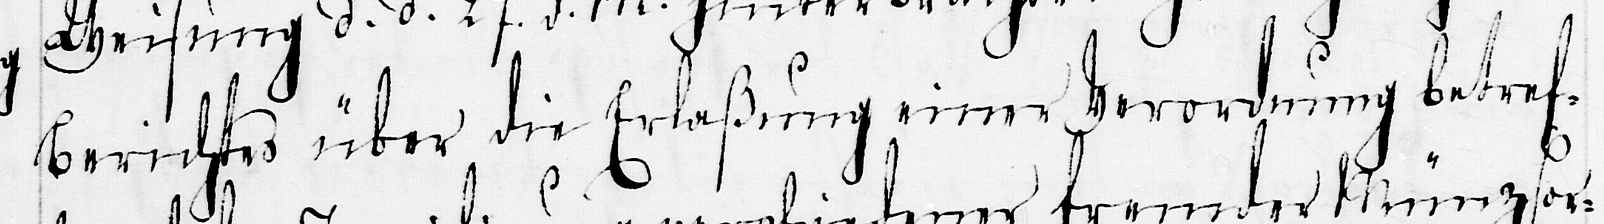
Berichtes über die Erlaßung einer Verordnung betref¬
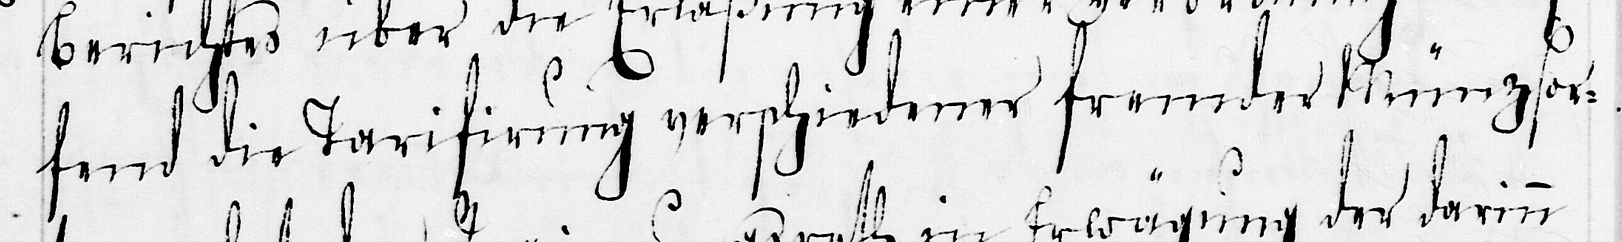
fend die Tarifirung verschiedener fremder Münzsor¬
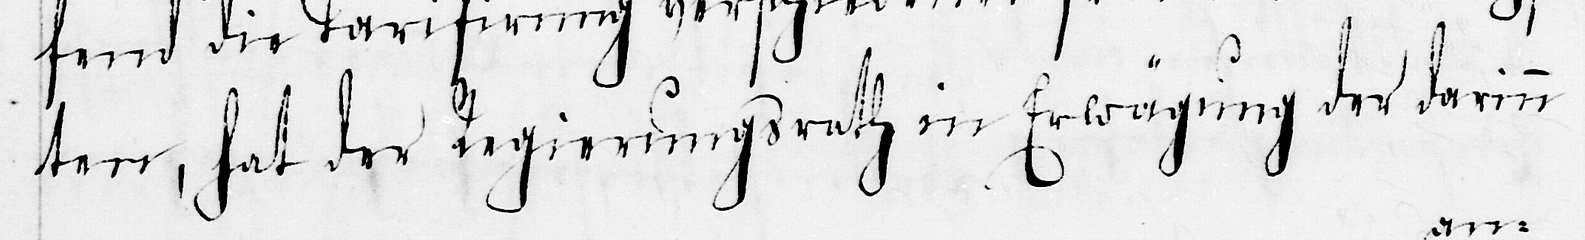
ten, hat der Regierungsrath in Erwägung der darinn
